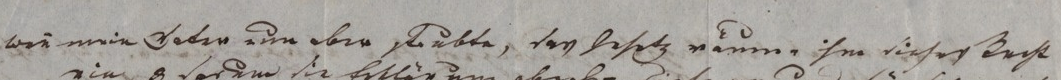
wenn mein Vater nun aber glaubte, das Gesetz räume ihm dieses Recht
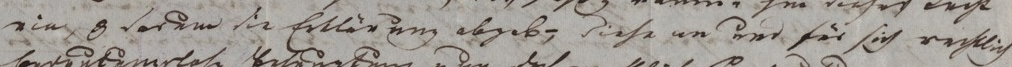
ein, & darum die Erklärung abgab, – diese an und für sich rechtlich
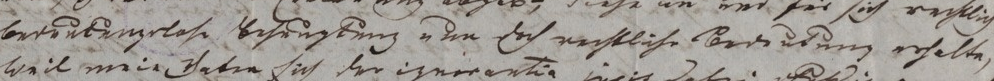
bedeutungslose Behauptung nun doch rechtliche Bedeutung erhalte,
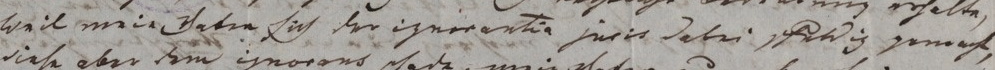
weil mein Vater sich der ignorantia juris dabei schuldig gemacht,
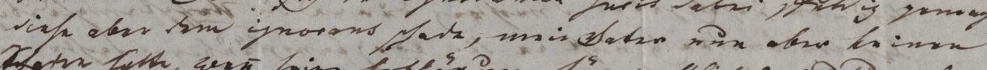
diese aber dem ignorans schade, mein Vater nun aber keinen
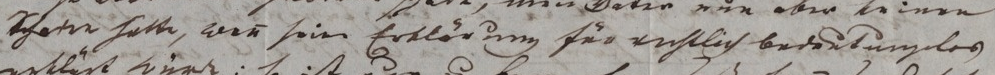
Schaden hätte, wenn seine Erklärung für rechtlich bedeutungslos
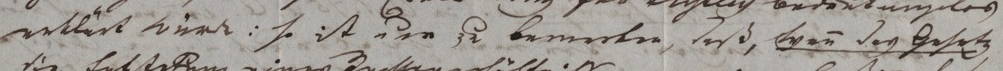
erklärt würde: so ist nur zu bemerken, daß, wenn das Gesetz
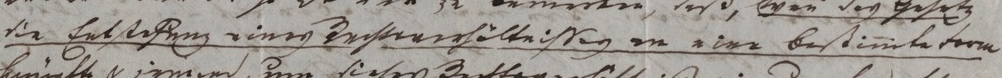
die Entstehung eines Rechteverhältnisses an eine bestimmte Form
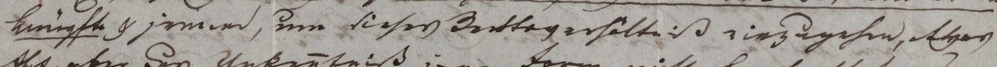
knüpft & jemand, um dieses Rechteverhältniß einzugehen, etwas
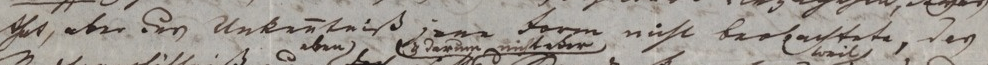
that, aber aus Unkenntniß jene Form nicht beobachtete, das
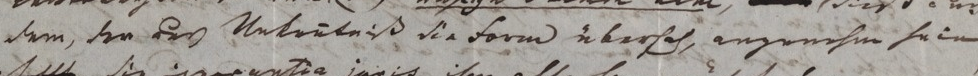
dem, der aus Unkenntniß die Form übersah, angenehm sein
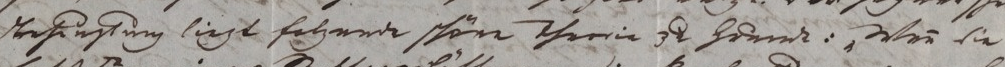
Behauptung liegt folgende schöne Theorie zu Grunde: «Wenn die
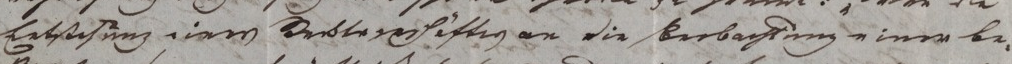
Entstehung eines Rechtsgeschäftes an die Beobachtung einer be-
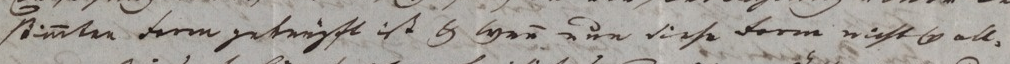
stimmten Form geknüpft ist & wenn nun diese Form nicht voll-
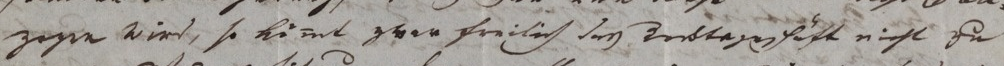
zogen wird, so kömmt zwar freilich das Rechtsgeschäft nicht zu
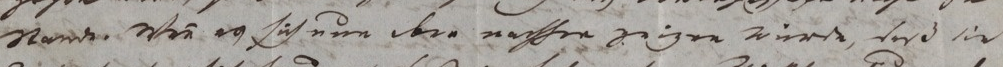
Stande. Wenn es sich nun aber nachher zeigen würde, daß die
